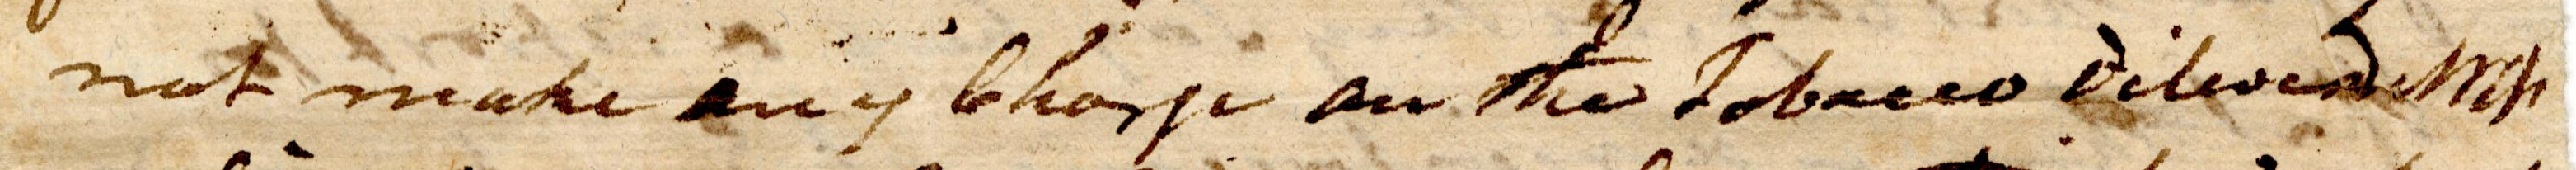not make my Charge on the Tobacco delived miss
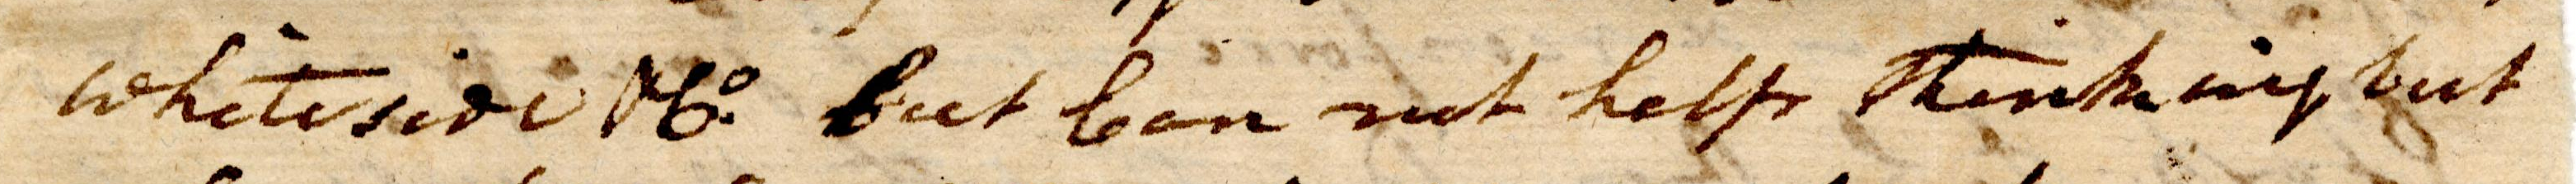whiteside &C^a. but Can not help thinking but
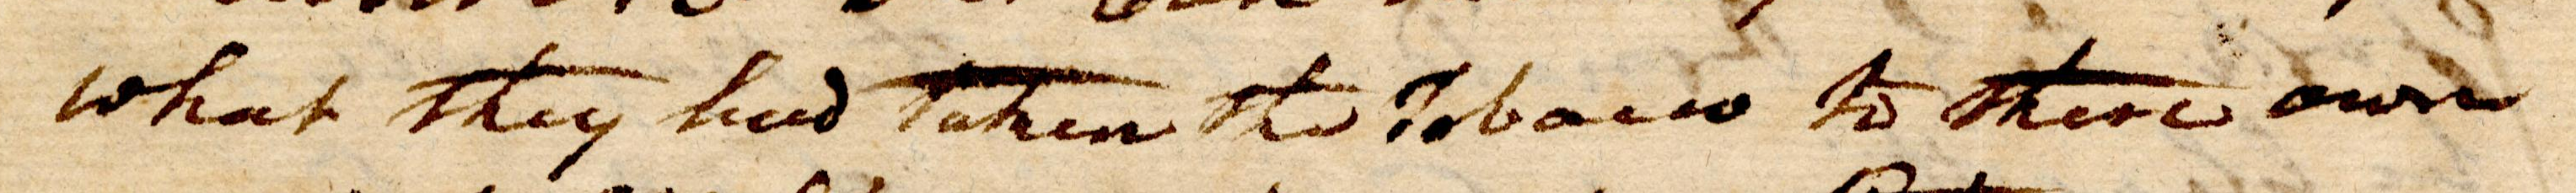what they had taken the Tobacco to there own
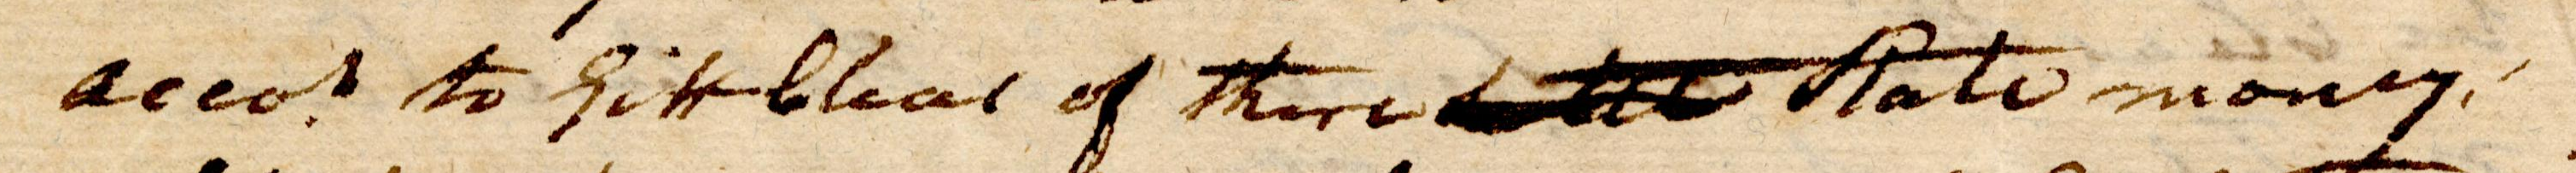acco^t to gitt clear of there [__] state money,
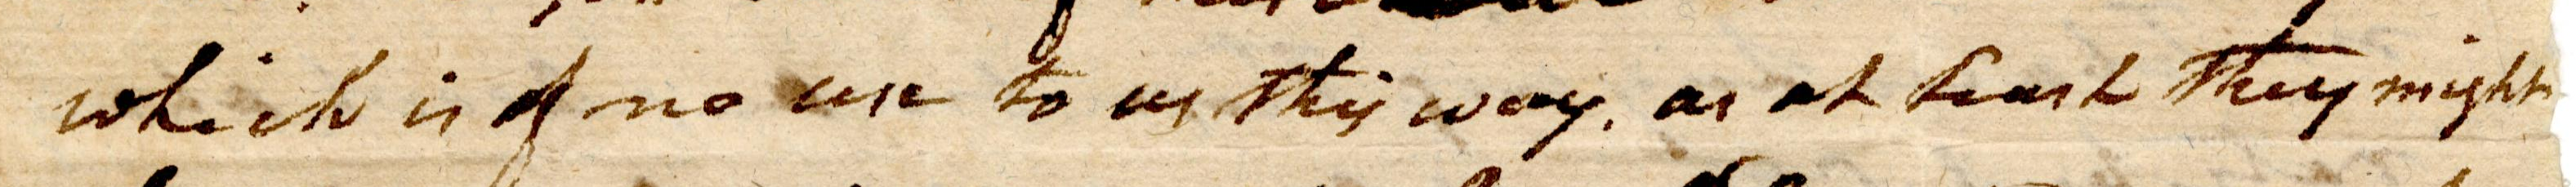which is of no use to us this way, as at last they might
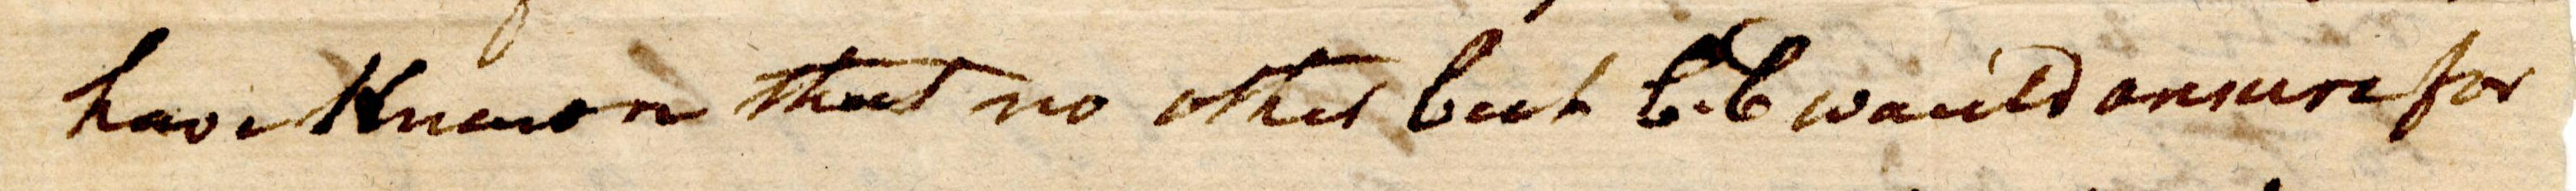have known that no other but C C would ansur for
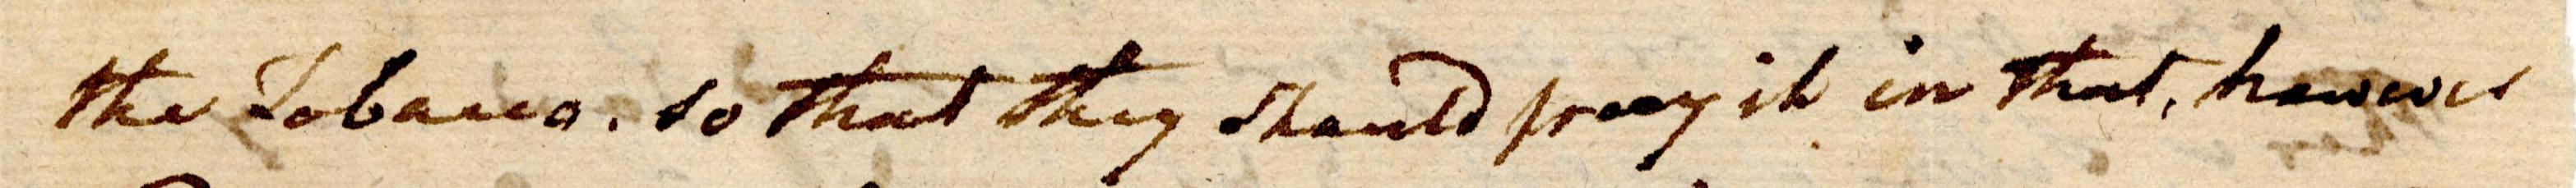the Tobacco; so that they should pray it in that, however
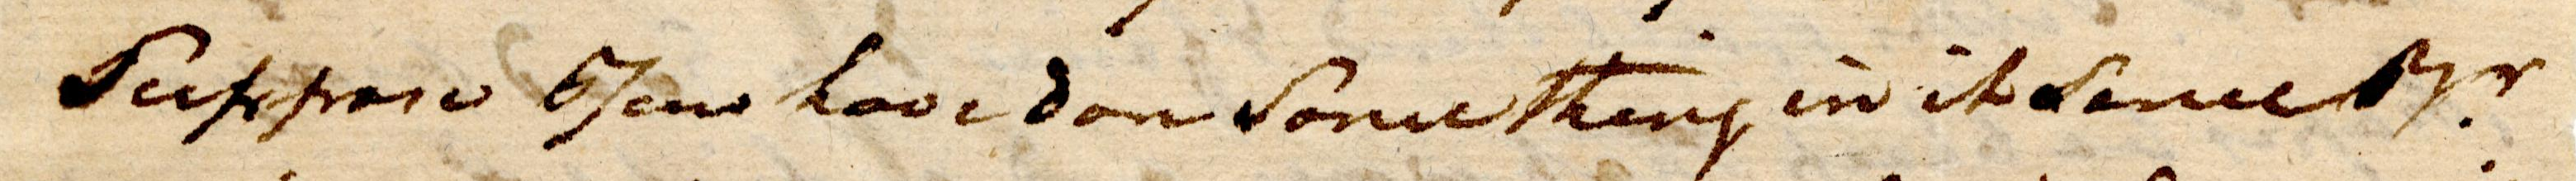Suppose you have done some thing in it since Y^r.
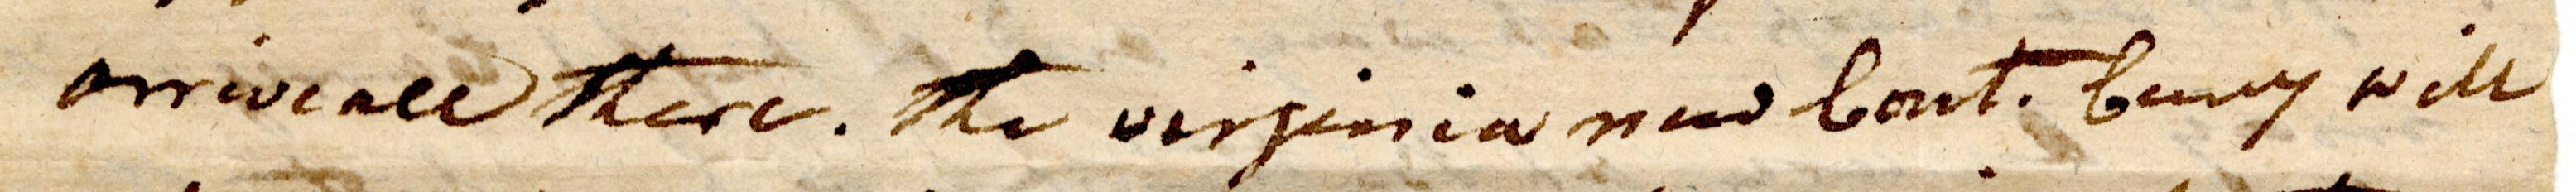arrivall there. the Virginia new Cout: Curry will
